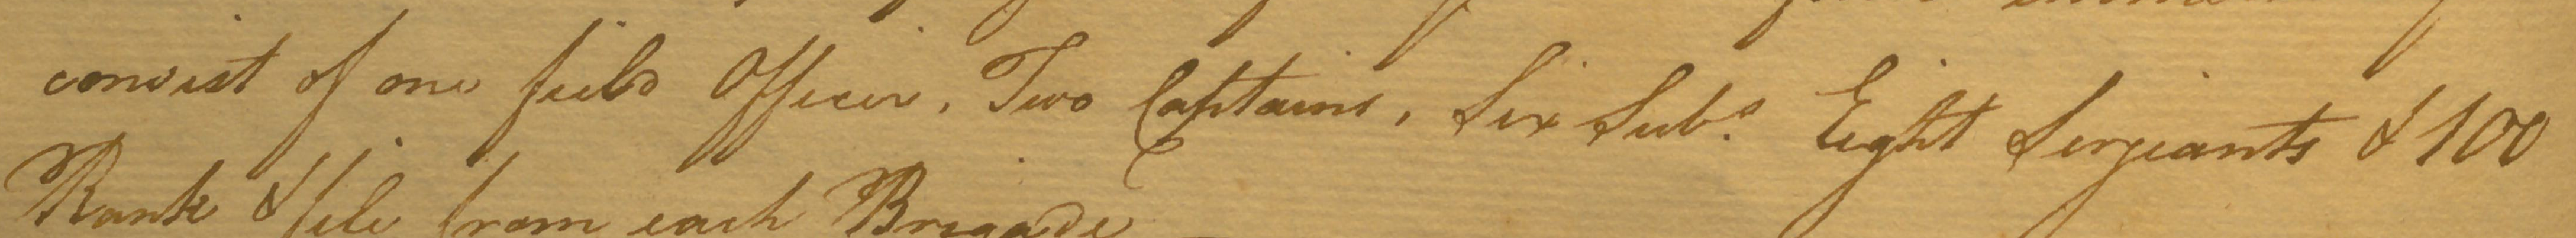consist of one field officer, Two Captains, Six Sub^s. Eight Serjeants & 100
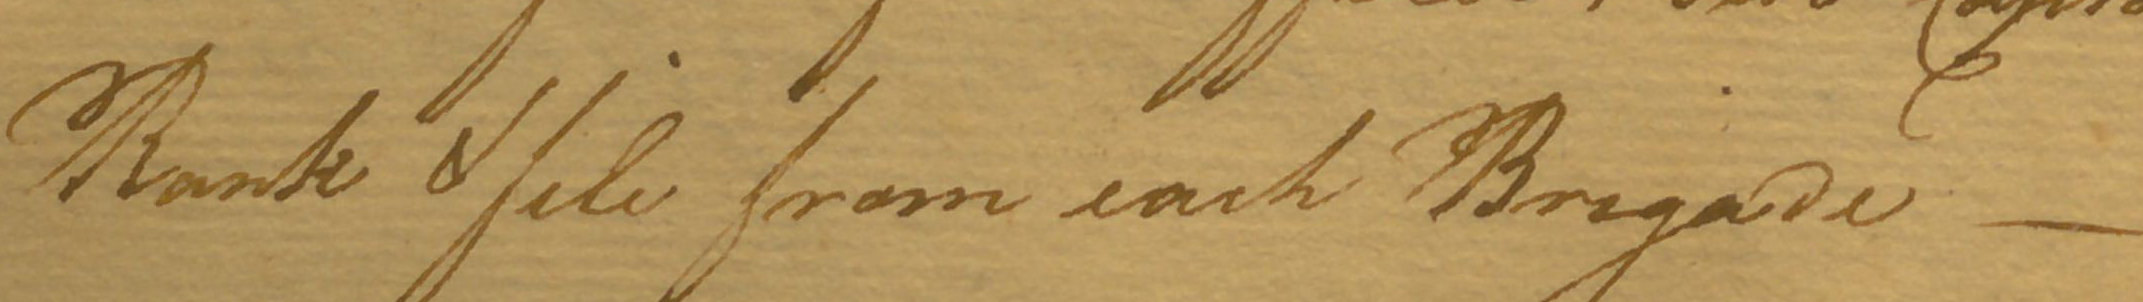Rank & file from each Brigade-
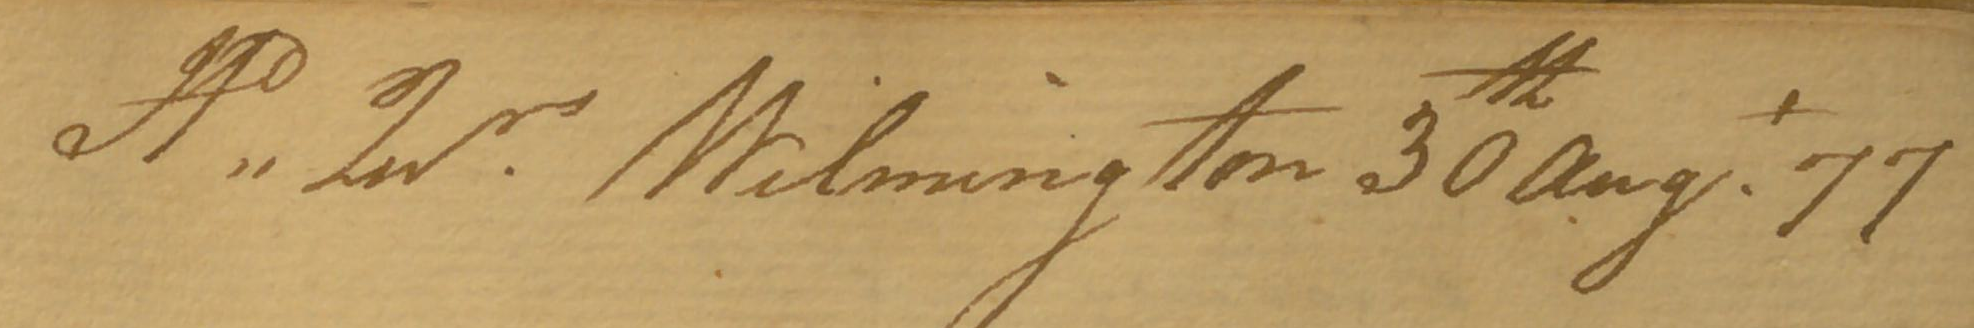H^d. Q^rs. Wilington 30^th. Aug^t. 77
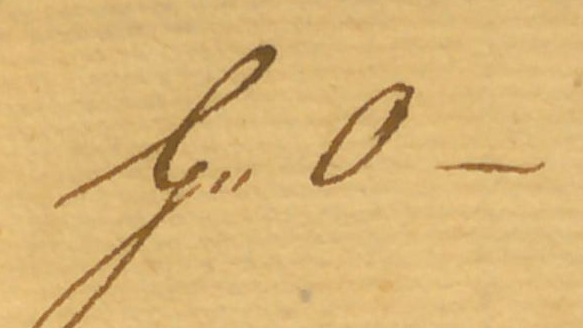G.O-
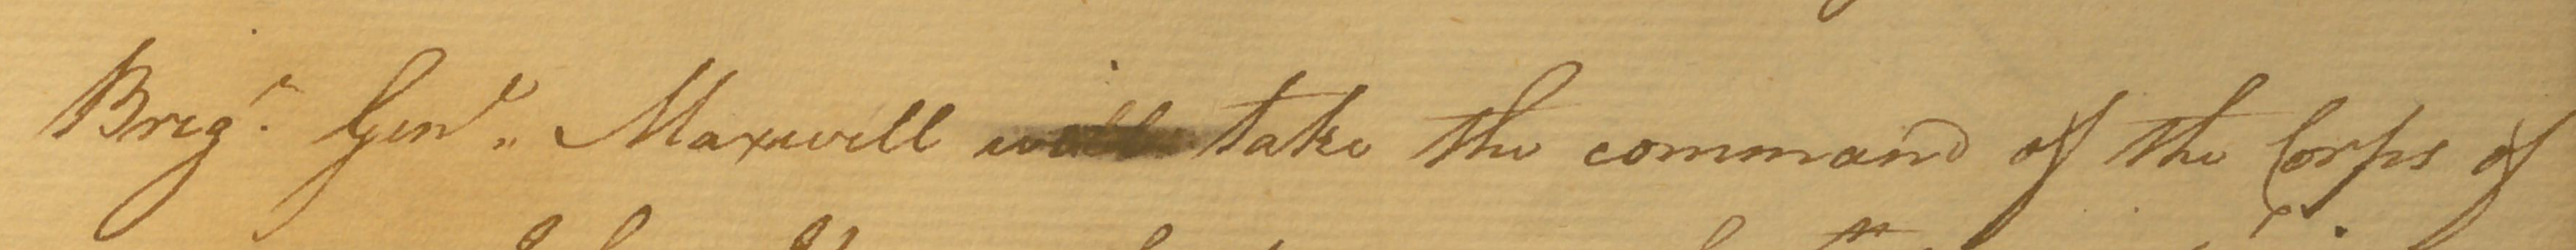Brig^r. Gen^l. Maxwell will take the command of the Corps of
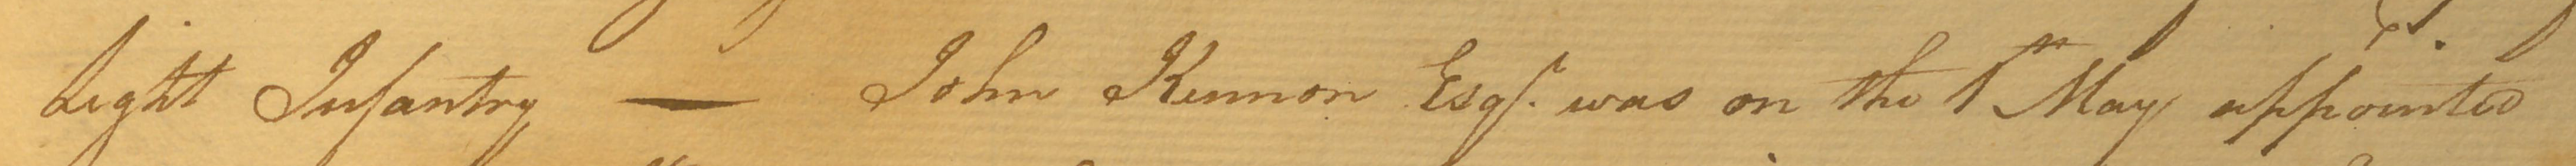Light Infantry- John Kennon Esq^r. was on the 1^st May appointed
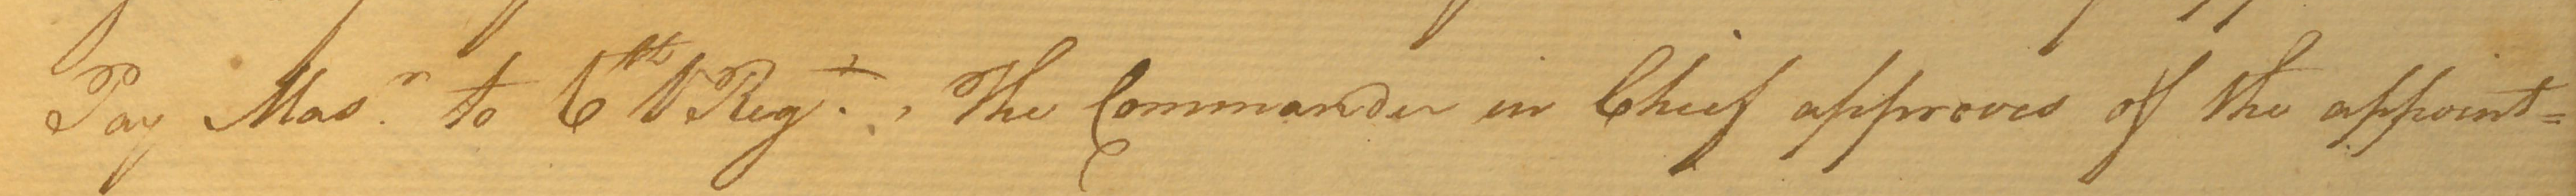Pay Mas^r. to 6^th V Reg^t. The Commander in Chief approves of the appoint-
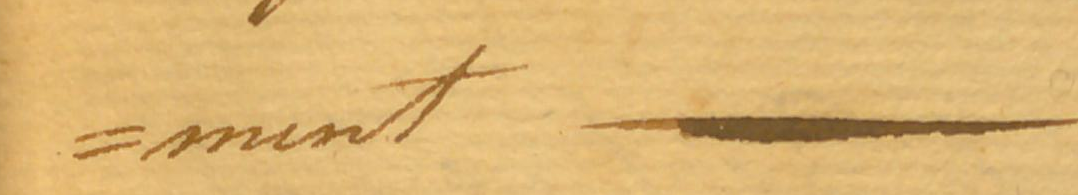-ment-
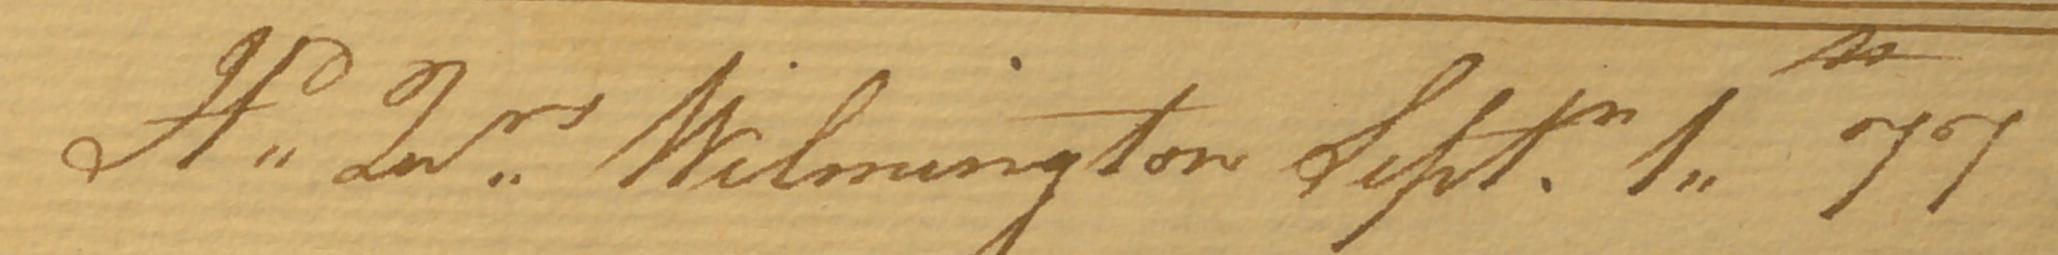H^d. Qu^rs. Wilmington Sept^r. 1^st. 77
